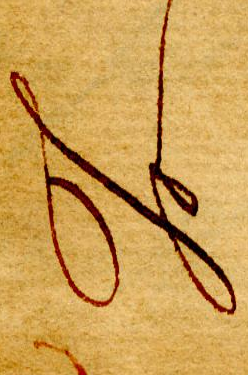To
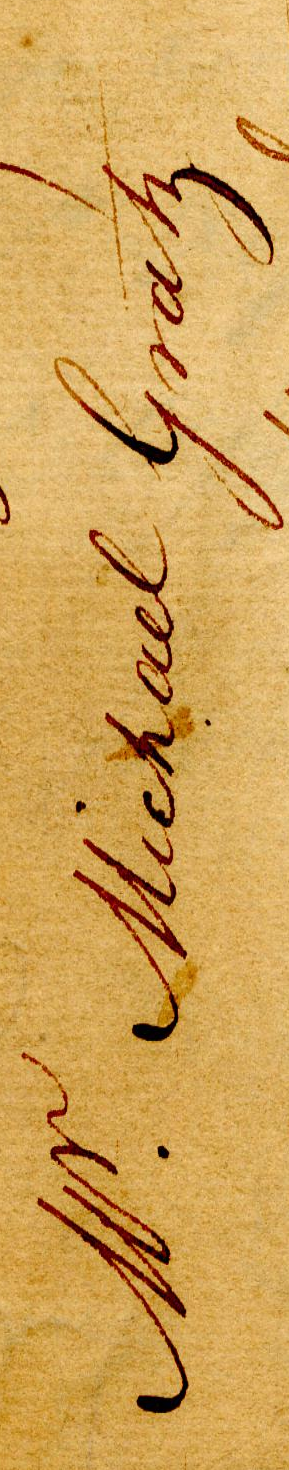M^r Michael Gratz
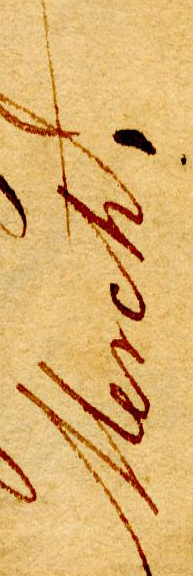Merch^t
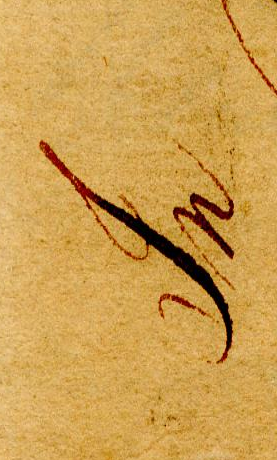In
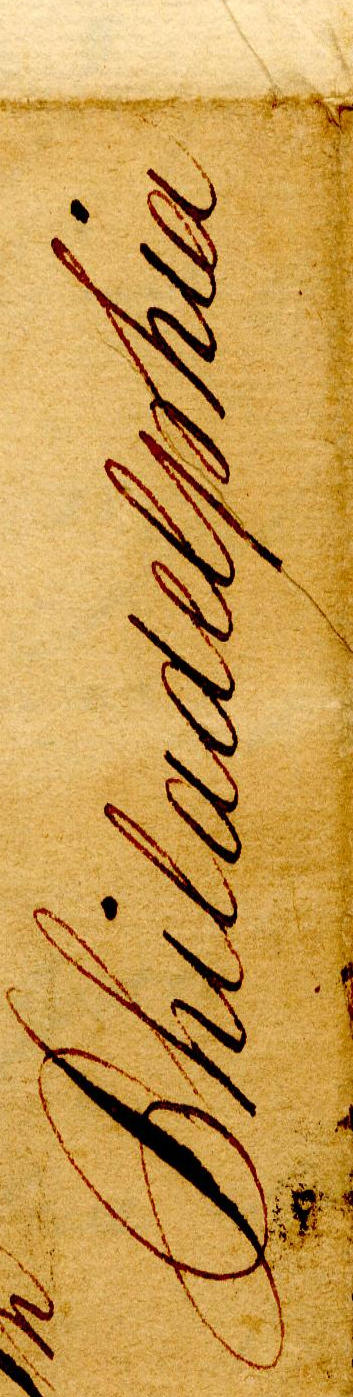Philadelphia
